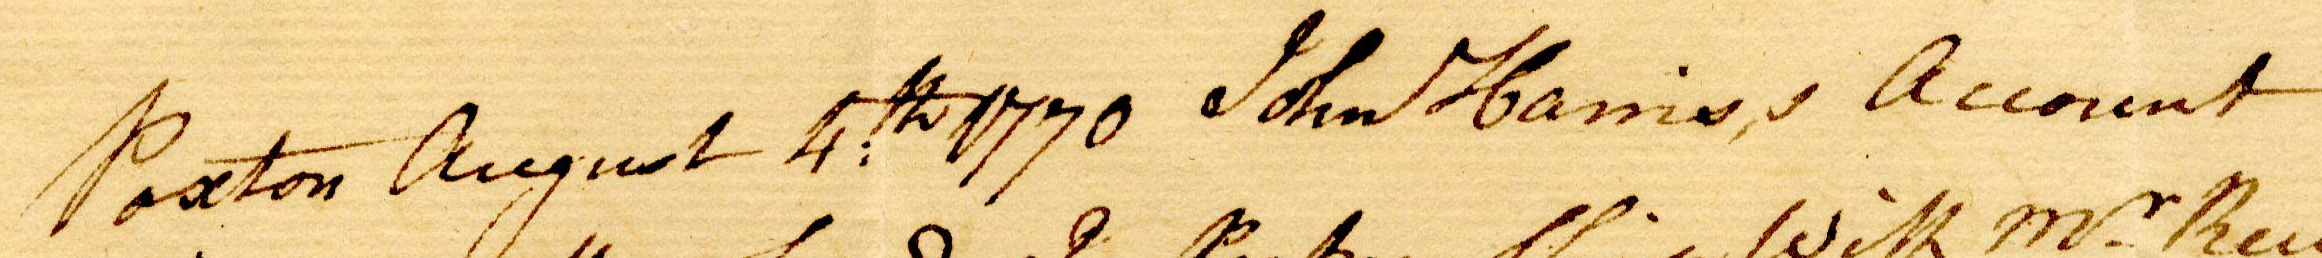Paxton August 4^th: 1770 John Harris's Account
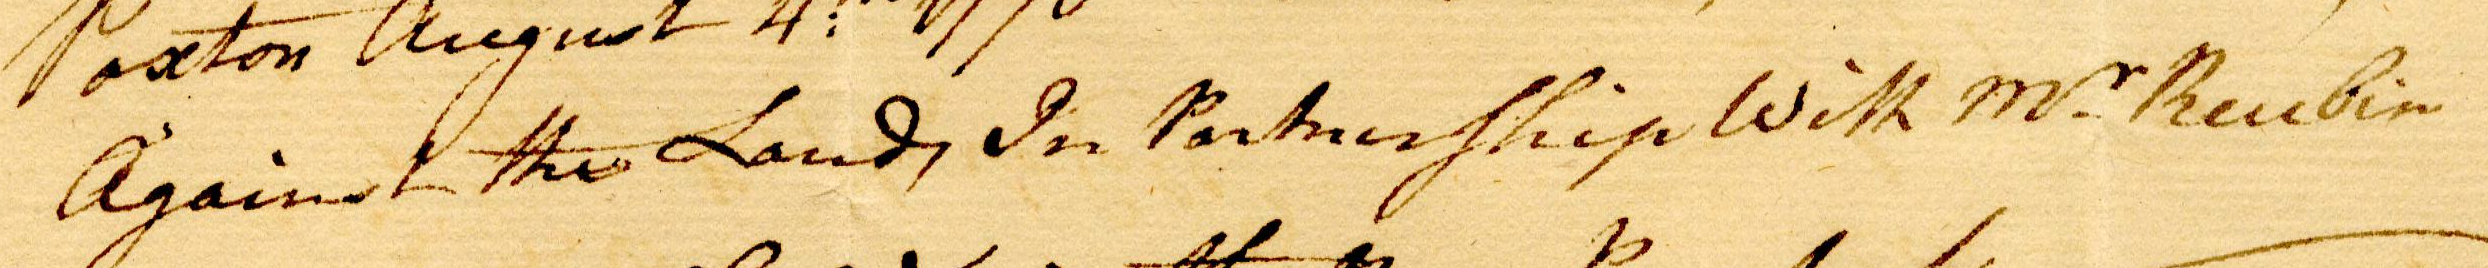Against the Land in Partnership with M^r. Reubin
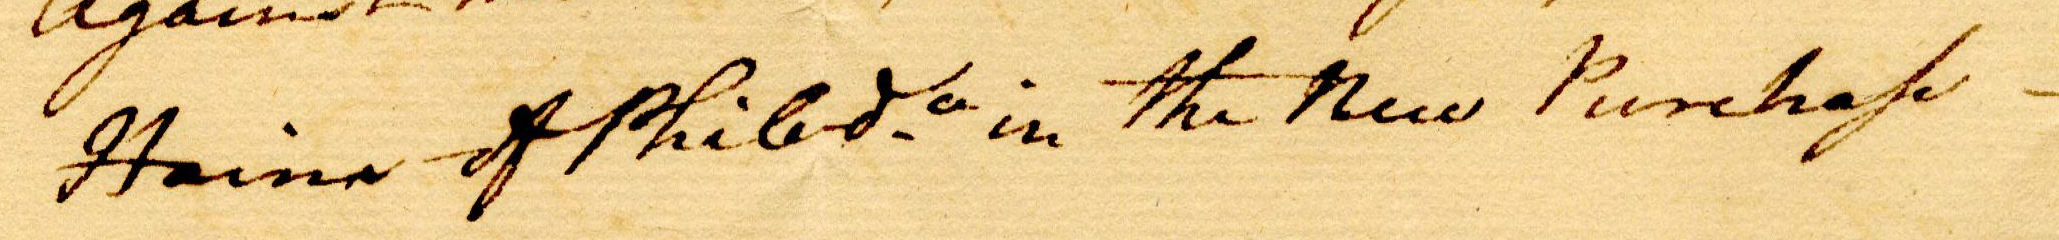Hains of Philad^a. in the new Purchase
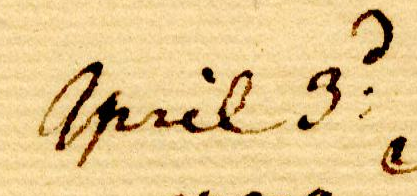April 3^d:
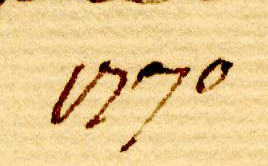1770
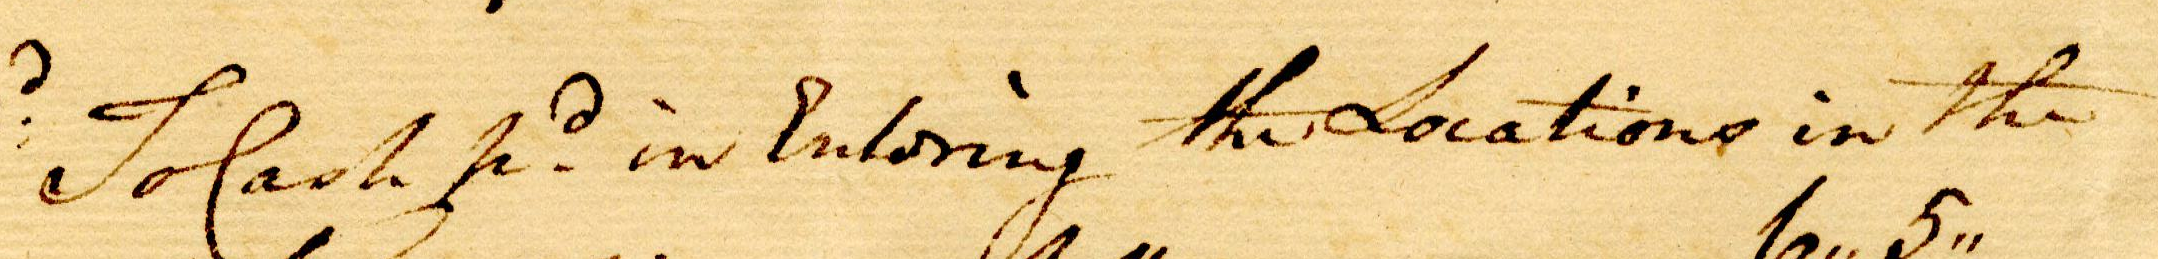To Cash p^d. in Entering the Locations in the
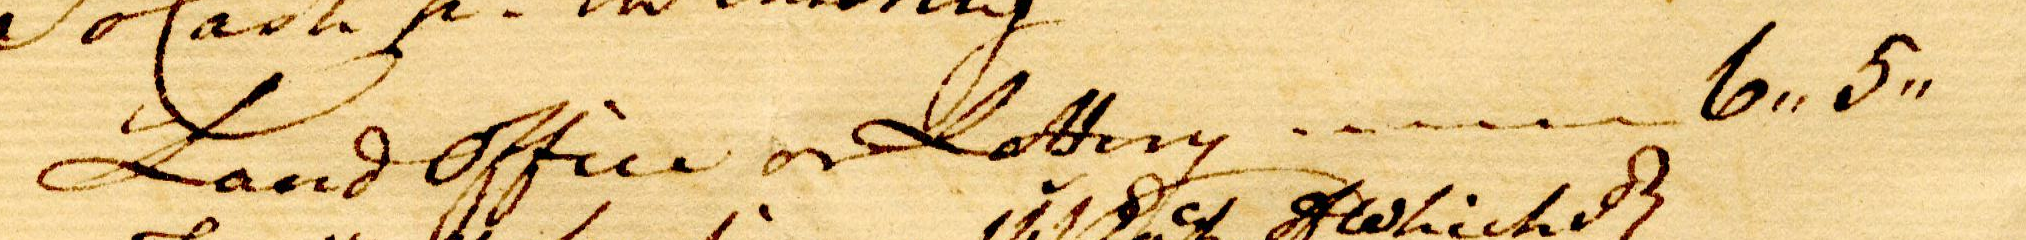Land office or Lottery- 6..5..
